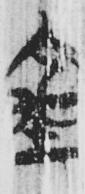○（禹）
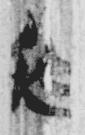於
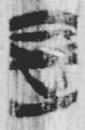是
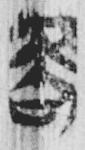唬（乎）
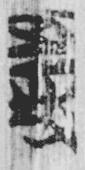襄（讓）
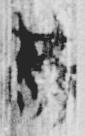益
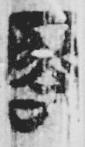啟
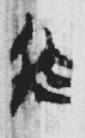於
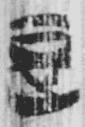是
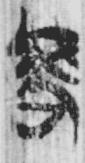唬（乎）
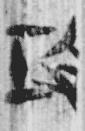攻
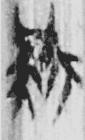益
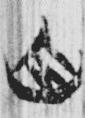自
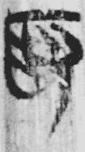取
